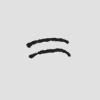二
